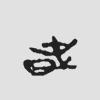萅
